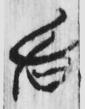左
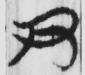尹
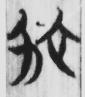{力它}
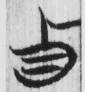貞
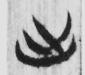出
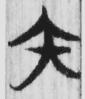內（入）
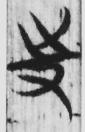寺（侍）
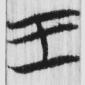王
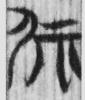𫵖
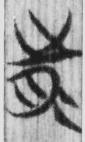之月
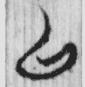㠯
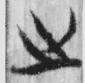之
